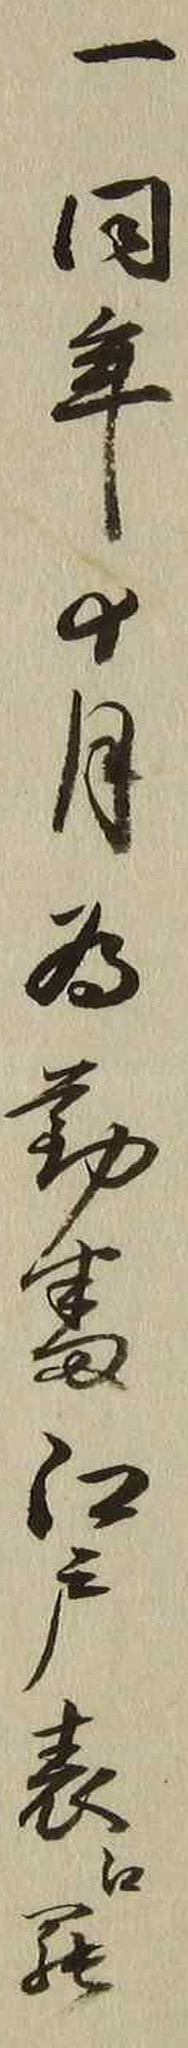一同年十月為勤番江戸表江罷
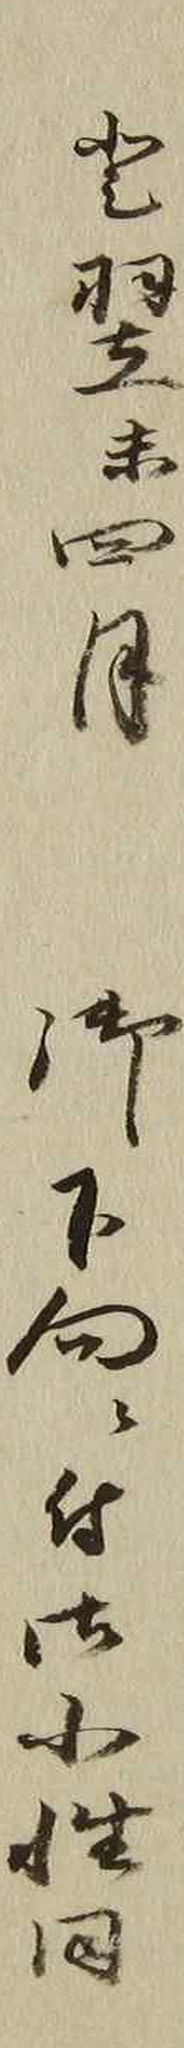登翌未四月御下向ニ付御小性同
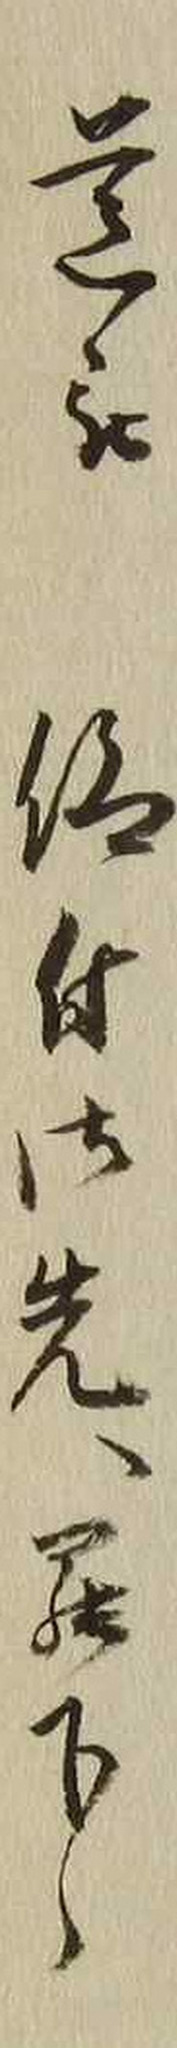道被仰付御先へ罷下候
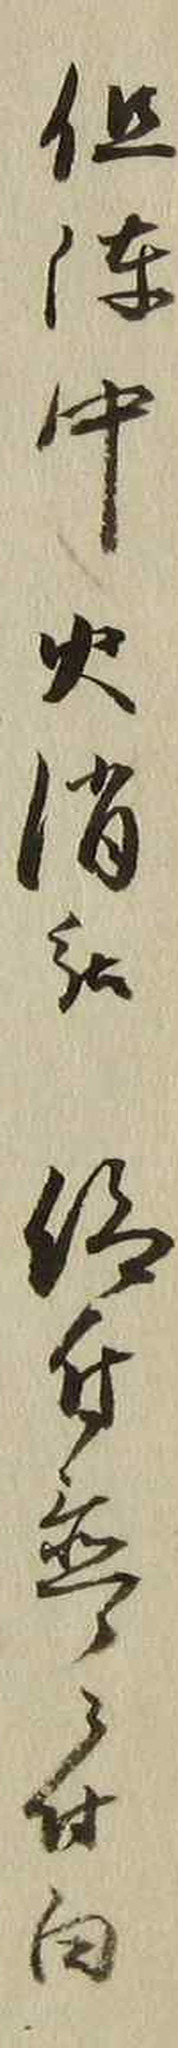但陣中火消被仰付置ニ付白
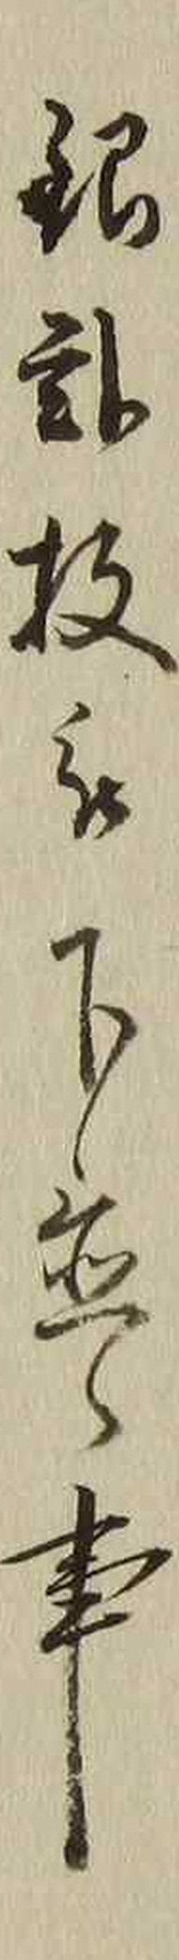銀弐枚被下置候事
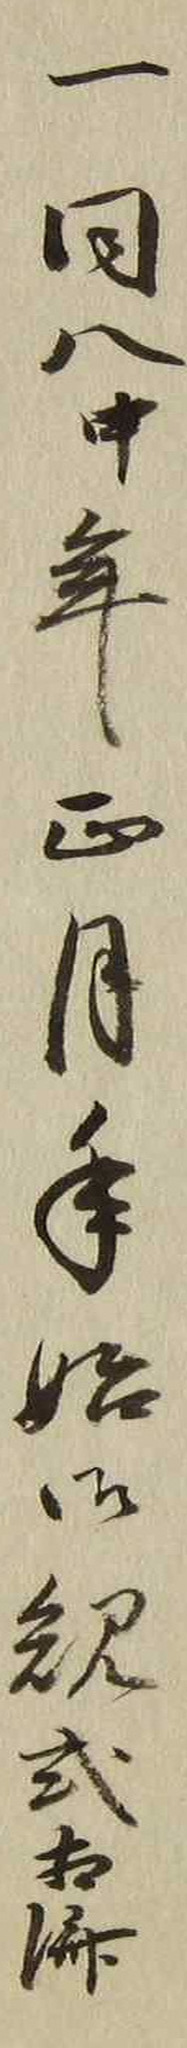一同八申年正月年始御規式相済
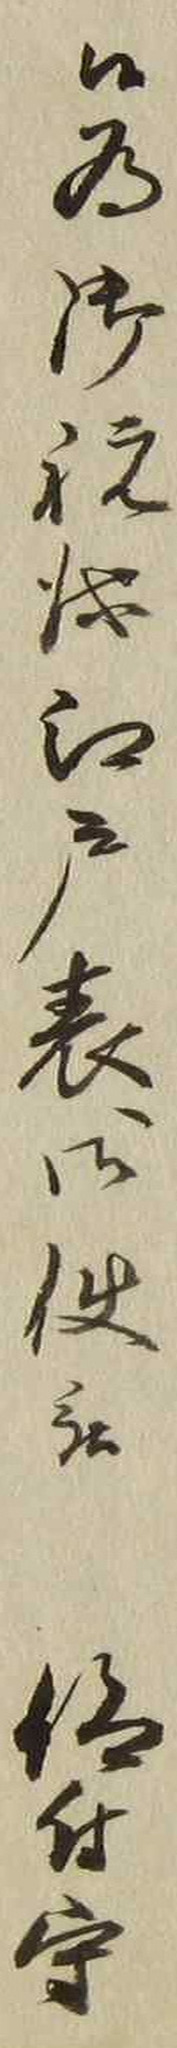候為御祝儀江戸表へ御使被仰付守
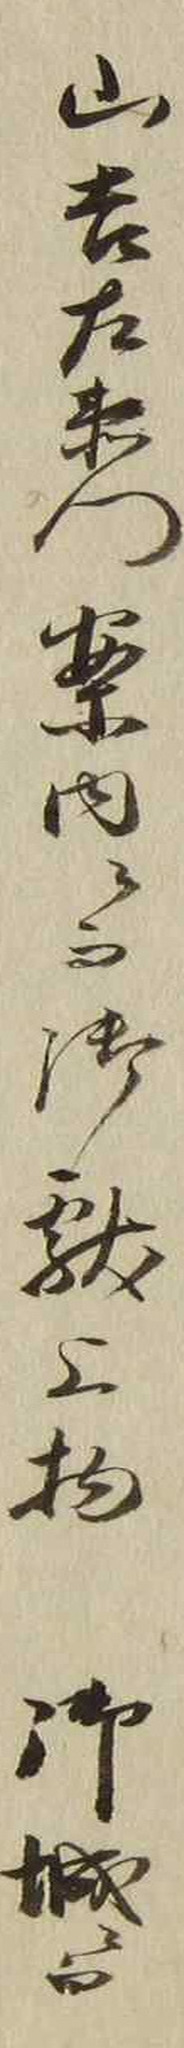山吉左衛門案内二而御献上物御城ニ而
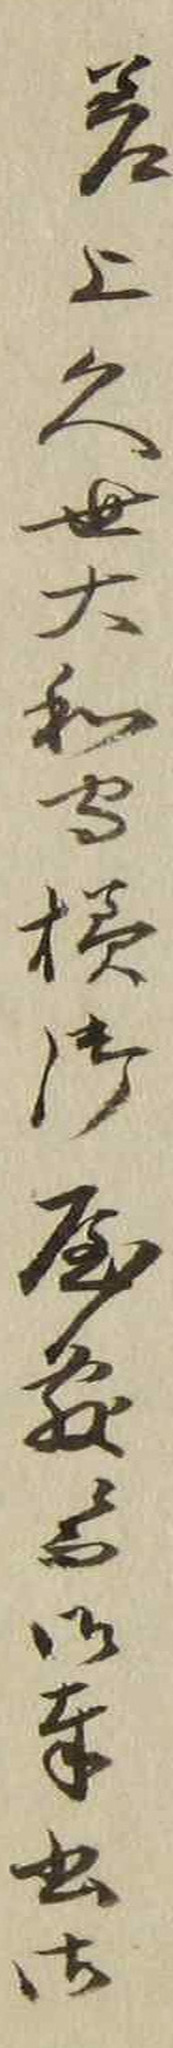差上久世大和守様御屋敷ニ而御奉書御
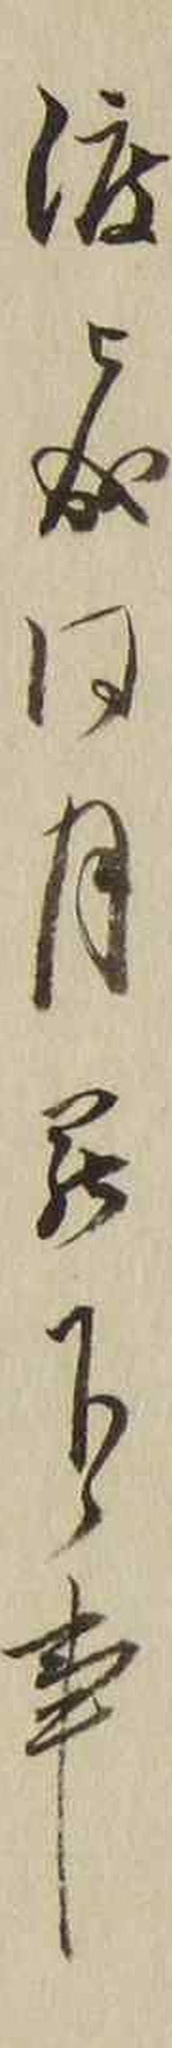渡被成同月罷下候事

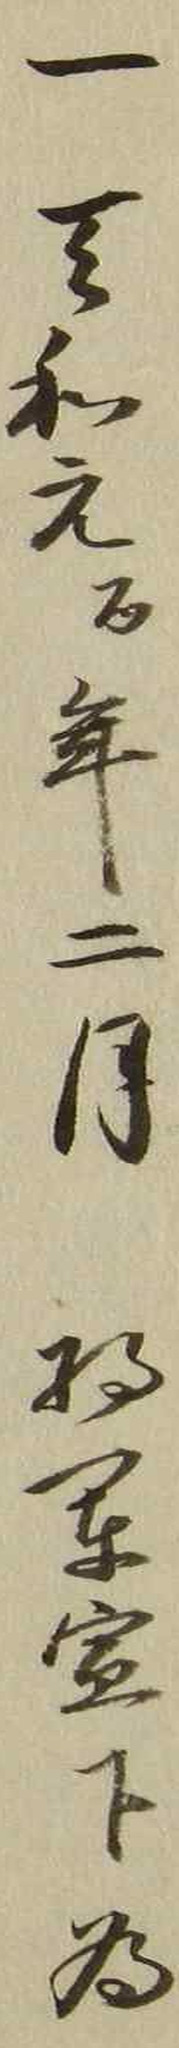一天和元酉年二月将軍宣下為
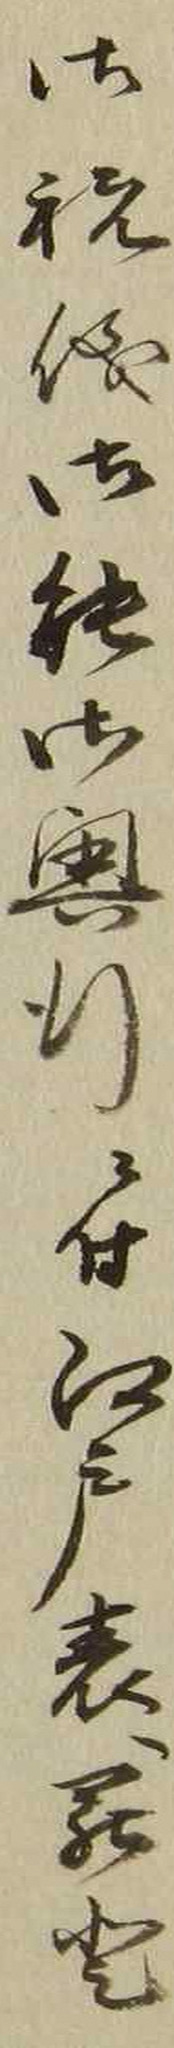御祝儀御能御興行ニ付江戸表へ罷登
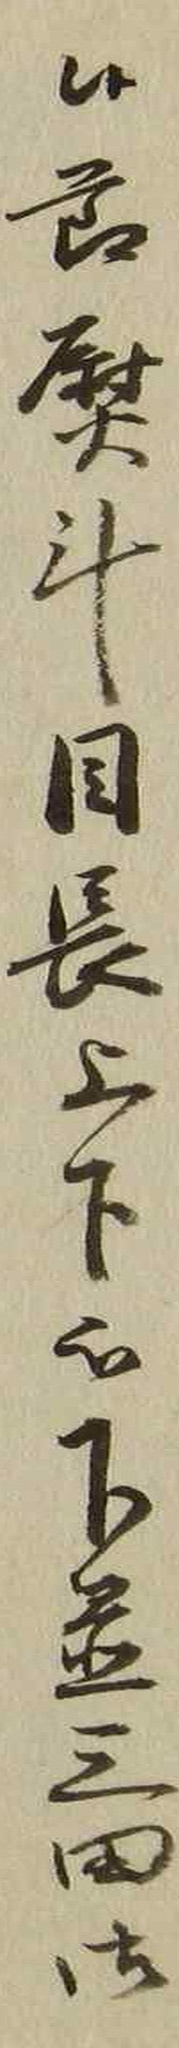候節熨斗目長上下被下置三田御
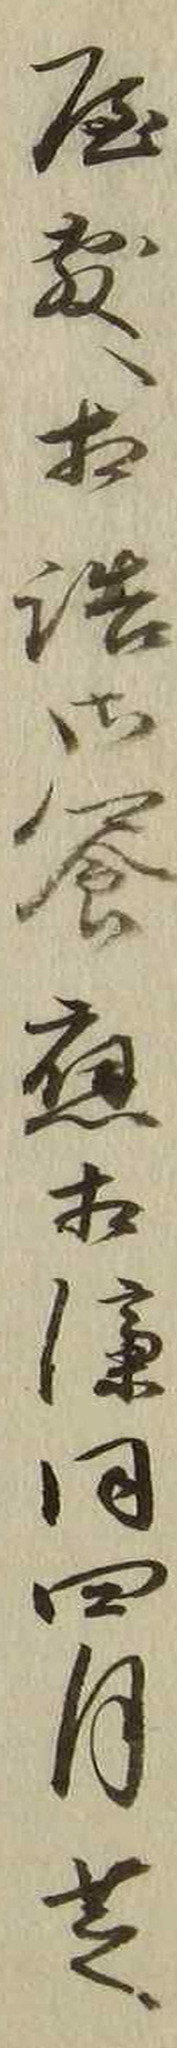屋敷へ相詰御饗応相済同四月芝
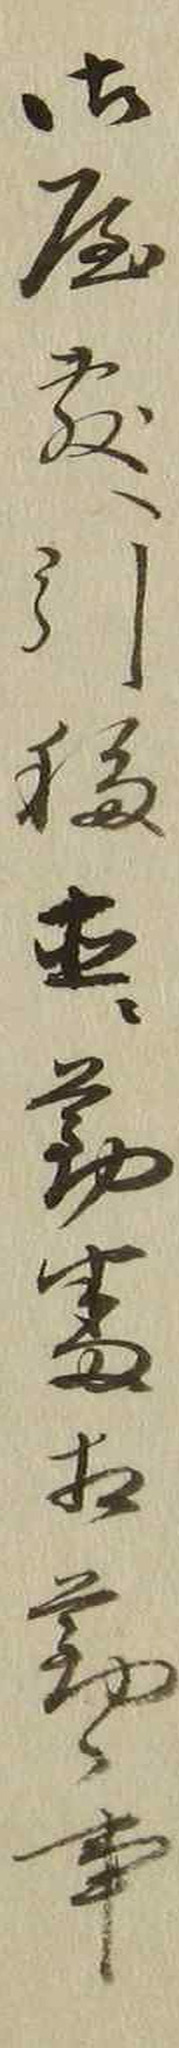御屋敷へ引移直ニ勤番相勤候事
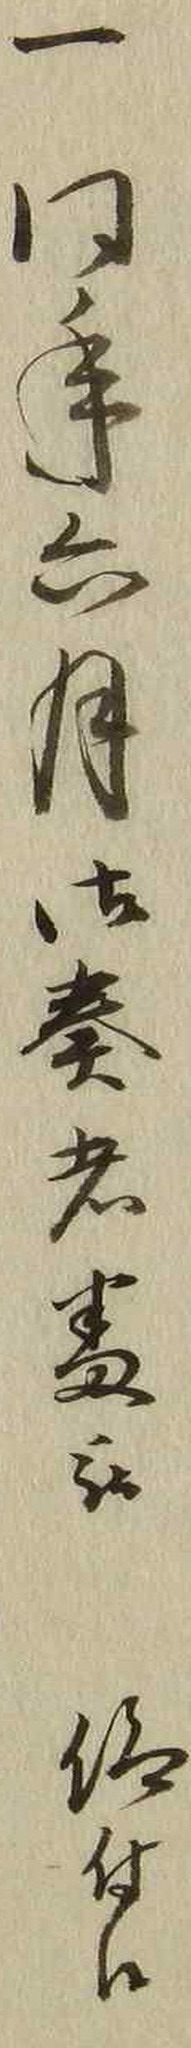一同年六月御奏者番被仰付候
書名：諸士系譜　巻之69　を之部3
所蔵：会津若松市立会津図書館
